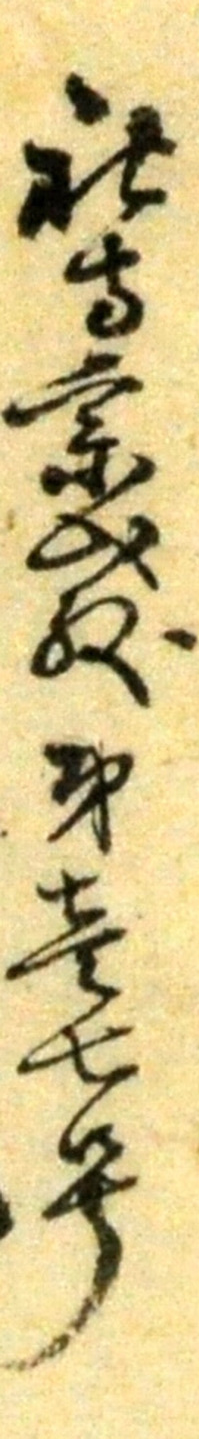社寺宗教第壱七号
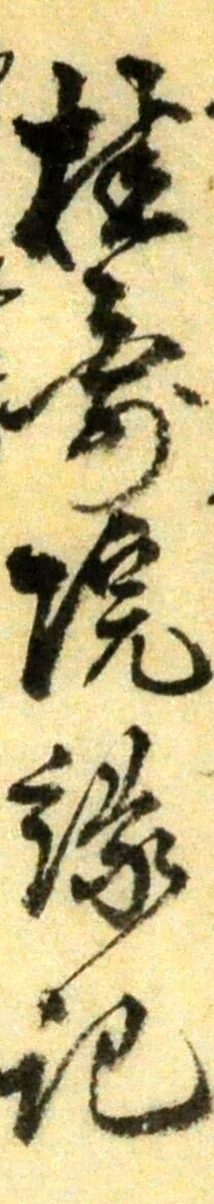桂壽院縁記
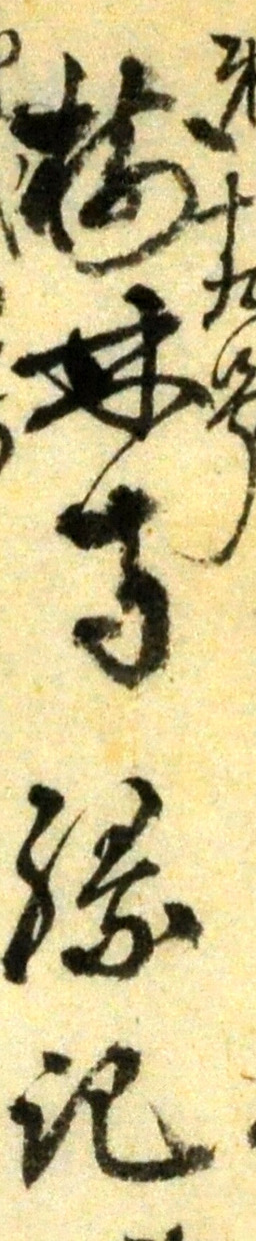東光寺縁記
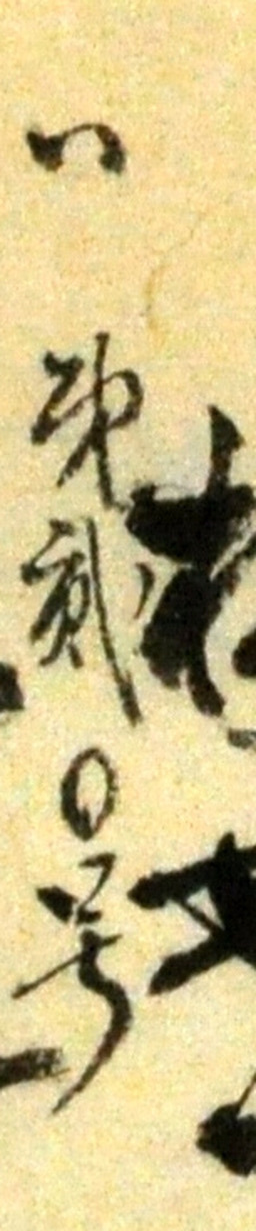同第弐○号
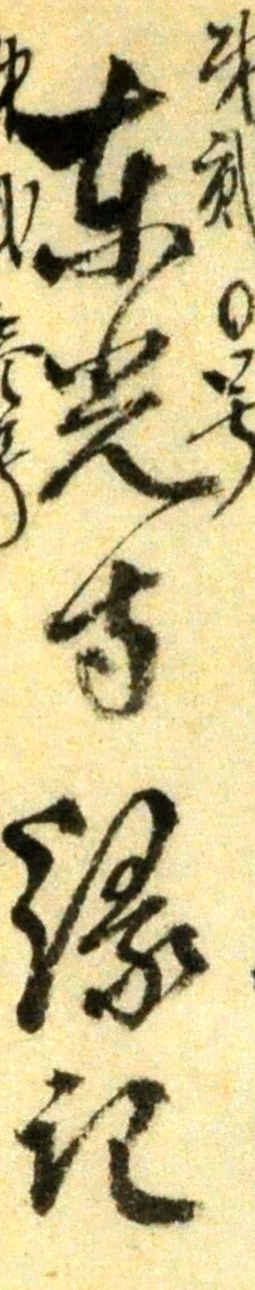東光寺縁記
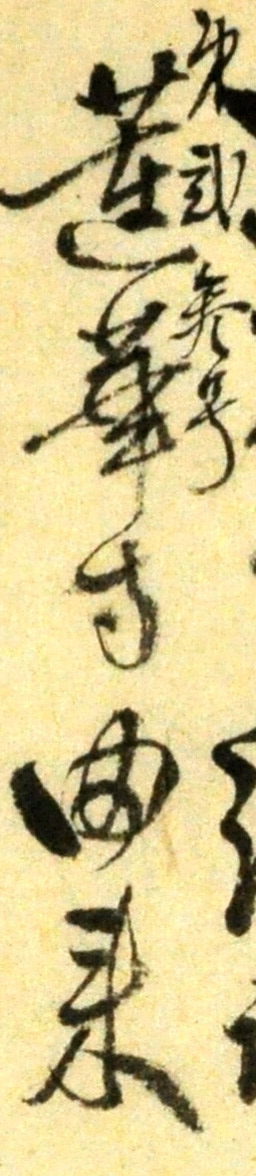蓮華寺由来
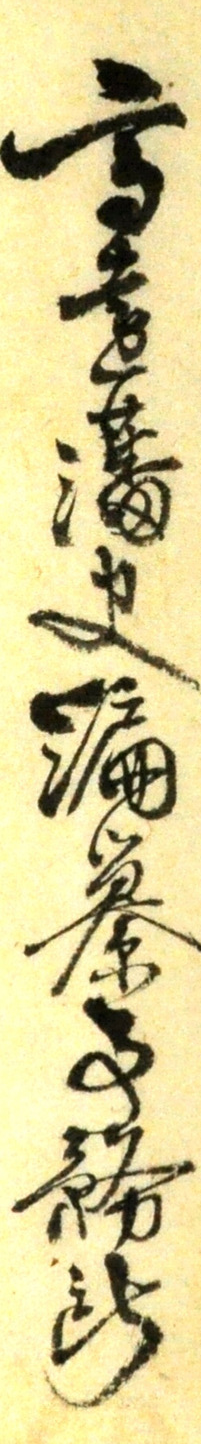高遠藩史編纂事務所

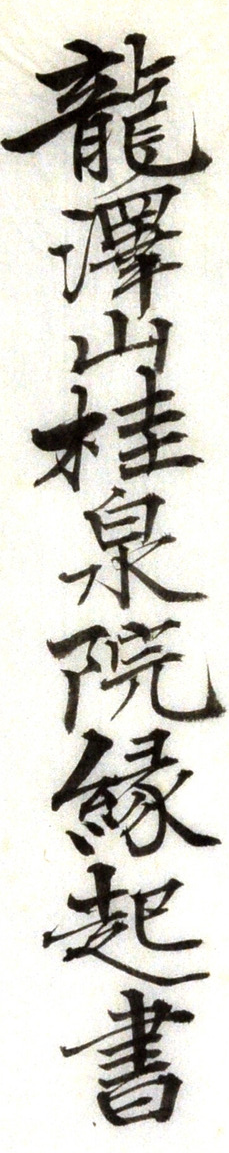龍澤山桂泉院縁起書
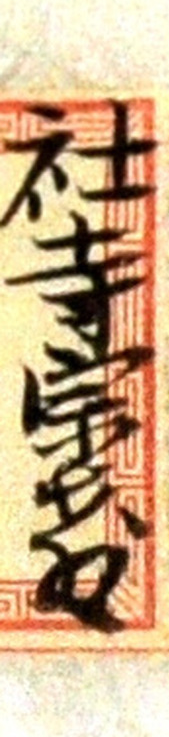社寺宗教
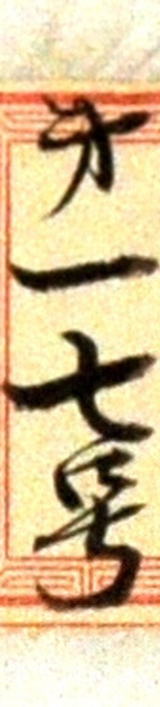第一七号

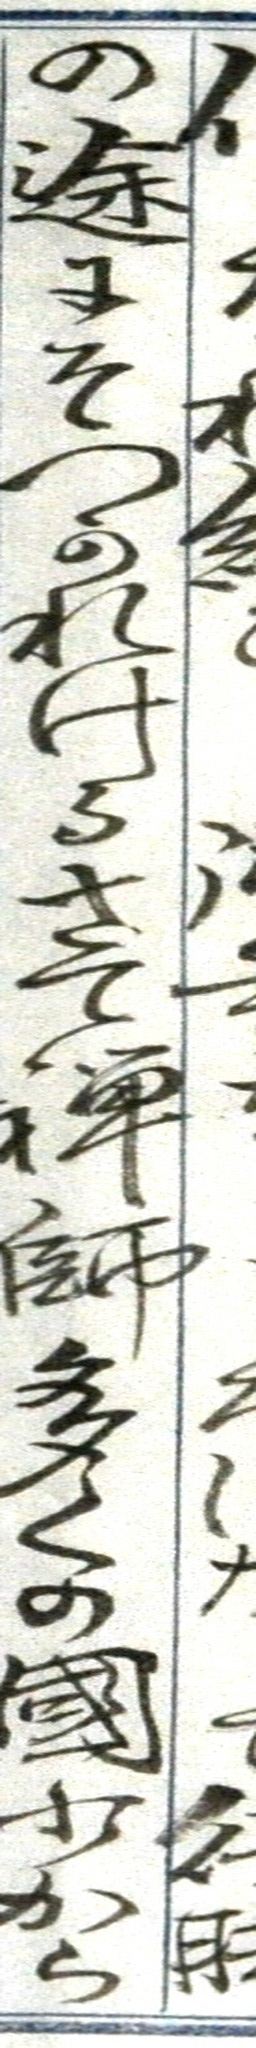の途にそつかれけるさて禅師多くの国少から
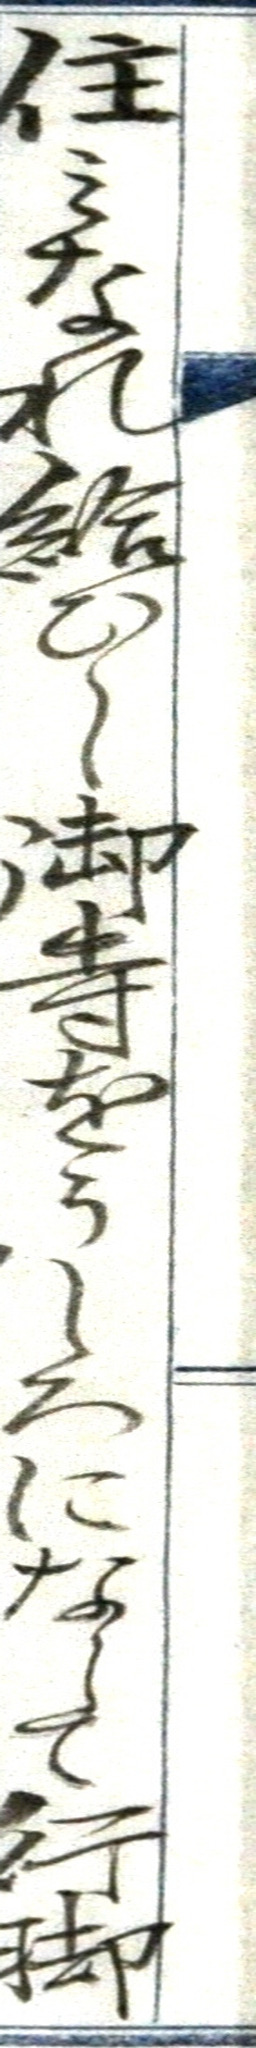住ミなれ給ひし御寺をうしろになして行脚
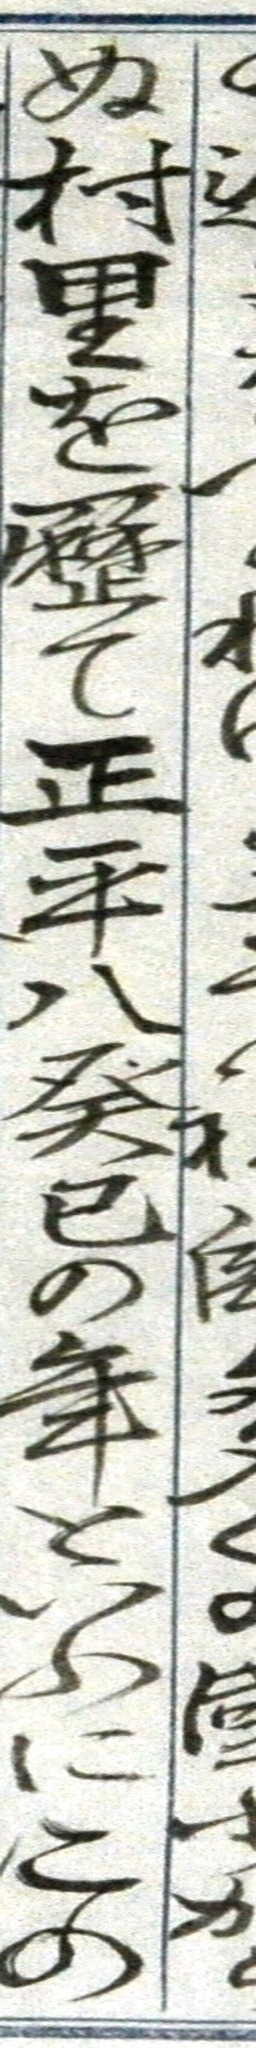ぬ村里を歴て正平八癸巳の年といふにこの
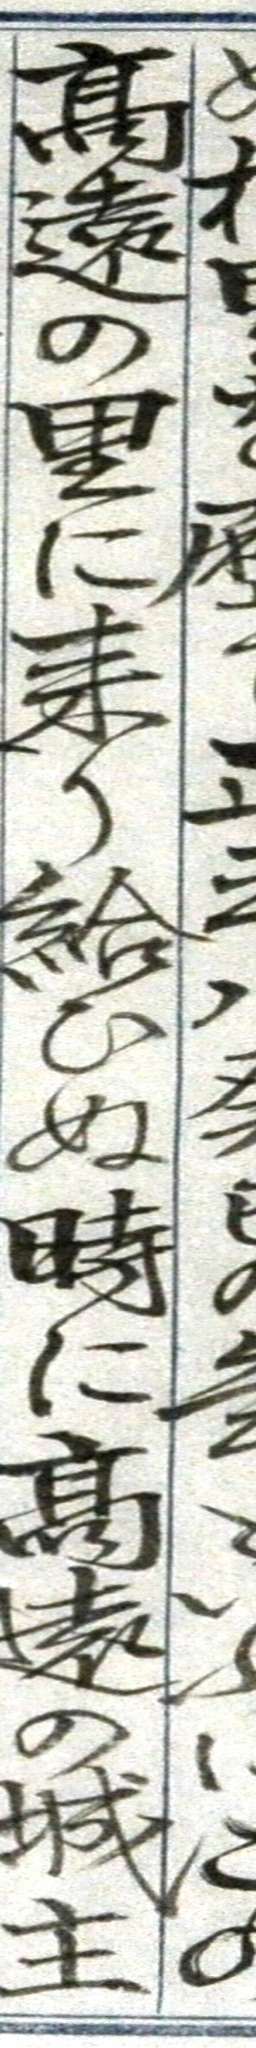高遠の里に来り給ひぬ時に高遠の城主
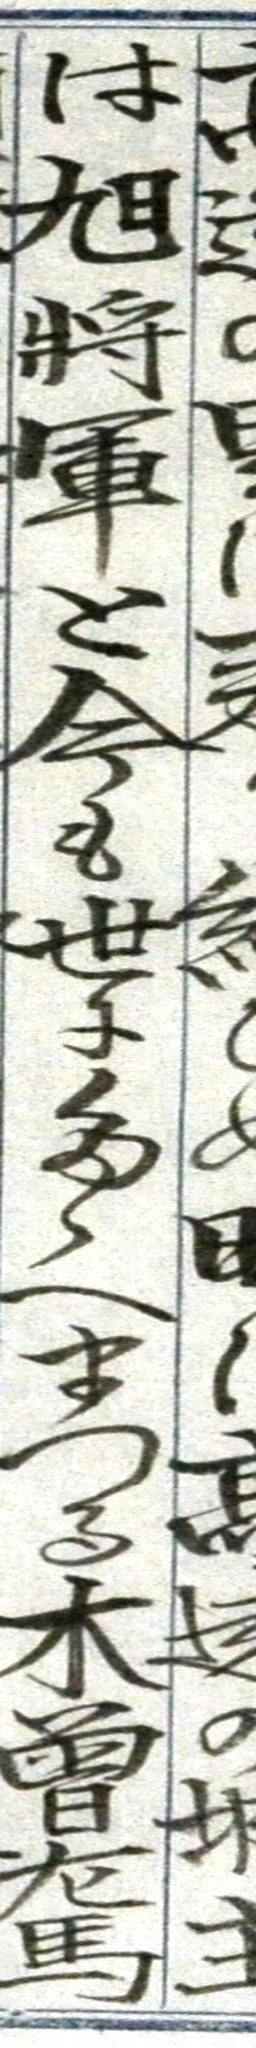は旭将軍と今も世にたゝへまつる木曽左馬
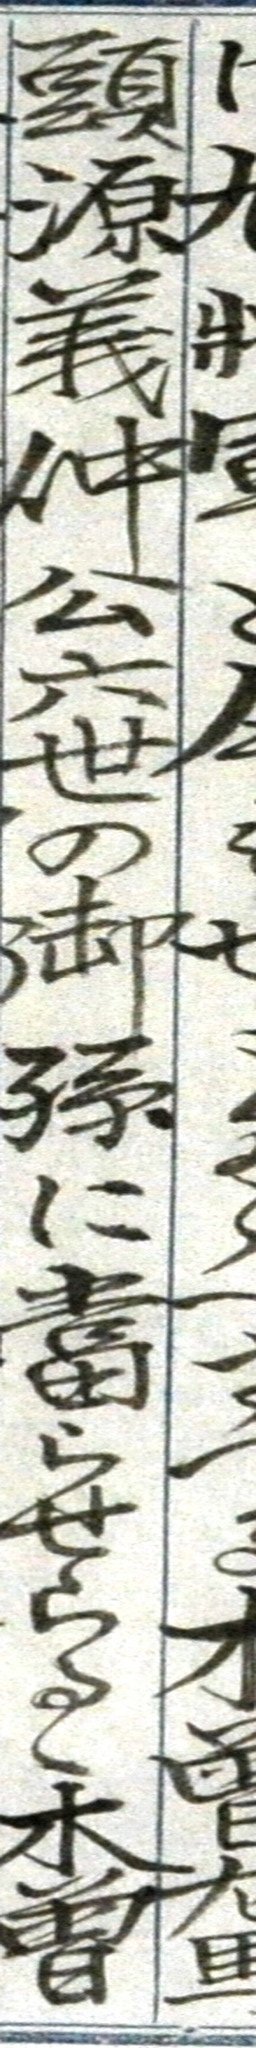頭源義仲公六世の御孫に当らせらるゝ木曽
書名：桂泉院・樹林寺・東光寺縁起書、蓮華寺由来書、付夕顔観音記
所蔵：伊那市立高遠町図書館・合同会社AMANE
